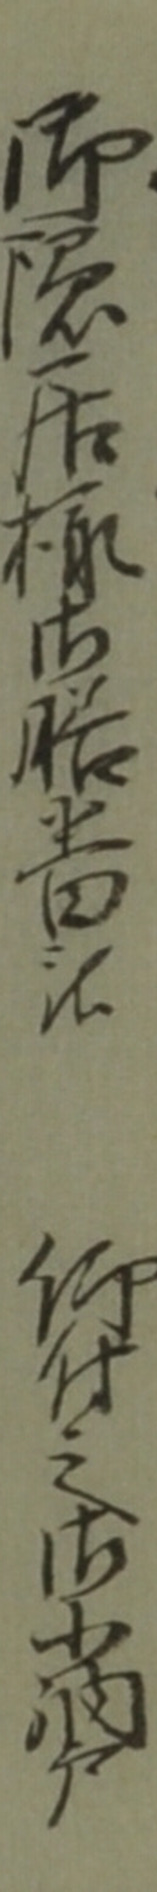御隠居様御膳番被仰付之御小納戸
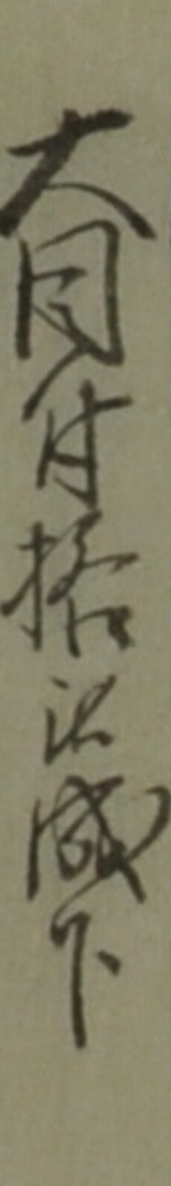大目付格被成下
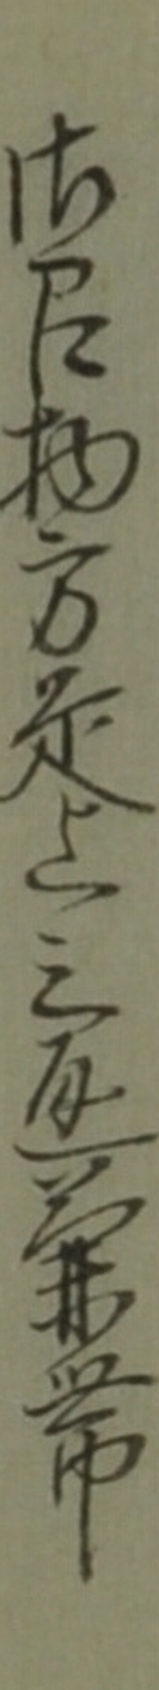御召物方是迄之通兼帯

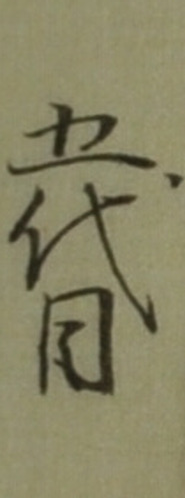五代目
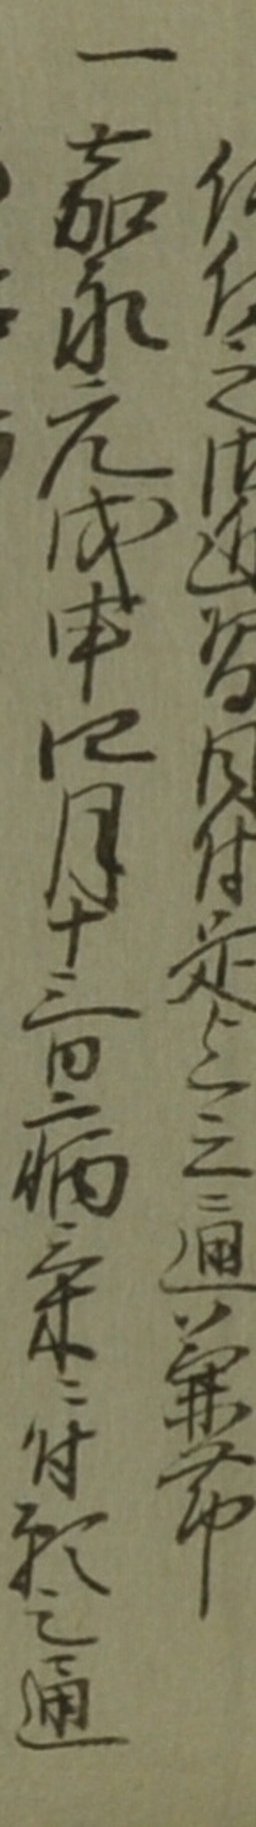一嘉永元戊申四月十三日病気ニ付願之通
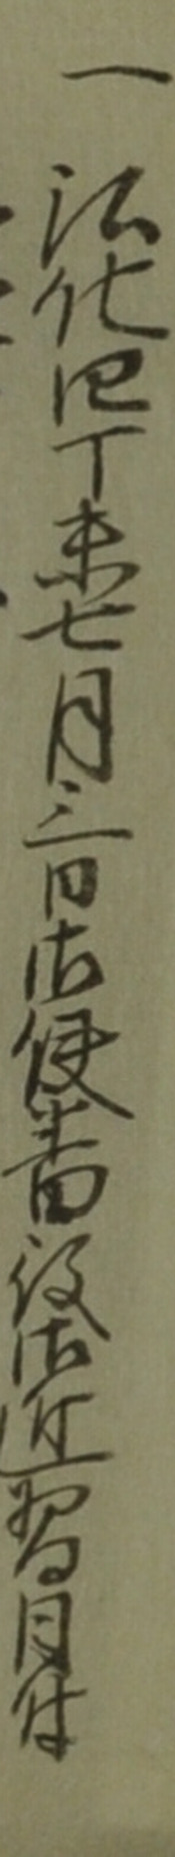一弘化四丁未七月三日御使番役御近習目付
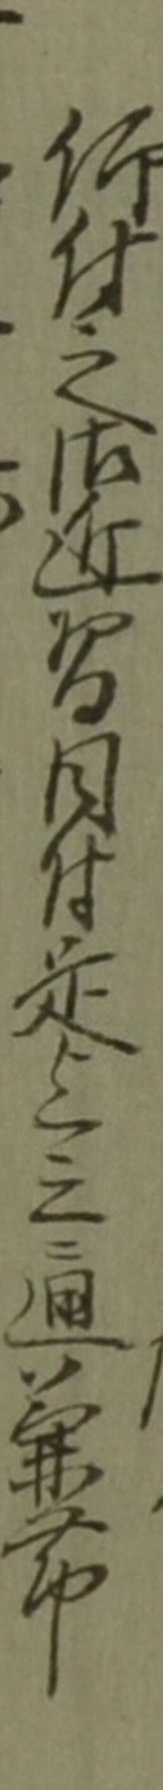仰付之御近習目付是迄之通兼帯
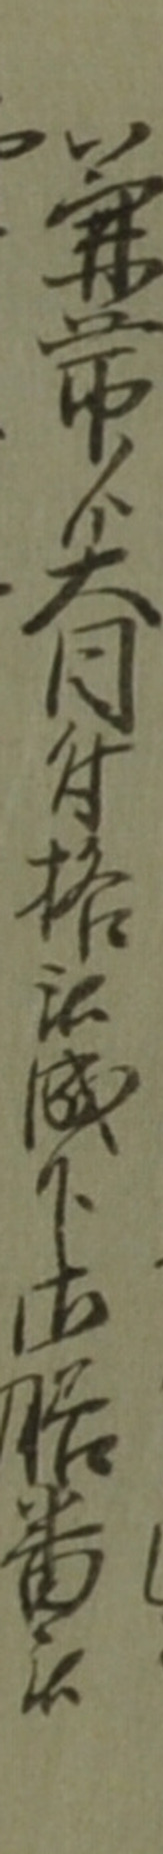兼帯ゟ大目付格被成下御膳番被
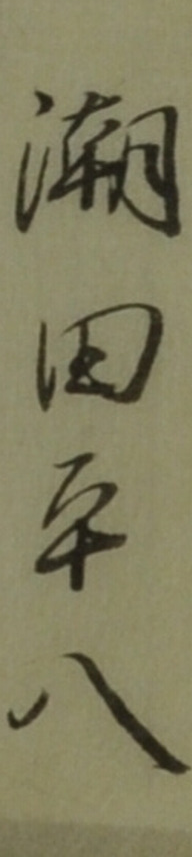潮田平八
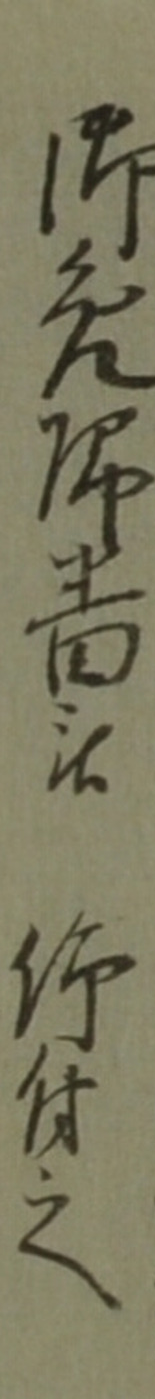御免帰番被仰付之
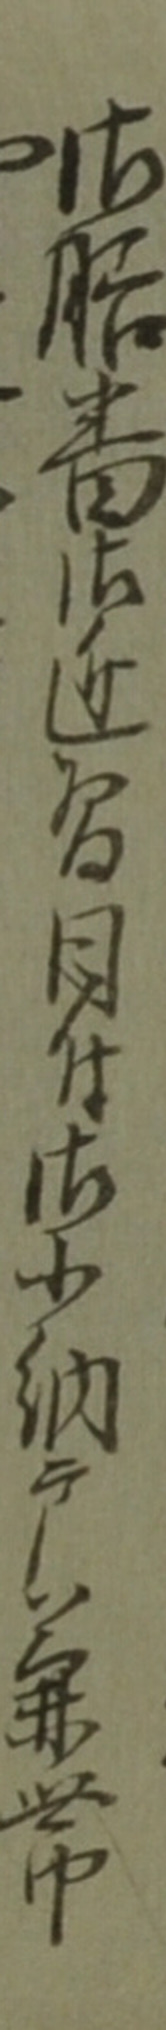御膳番御近習目付御小納戸兼帯
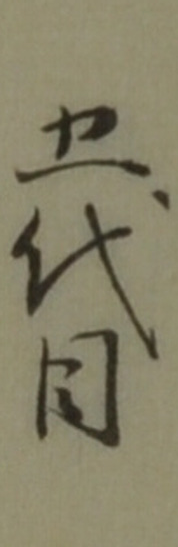五代目
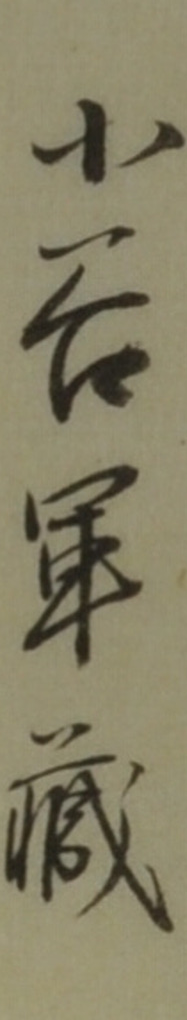小谷軍蔵
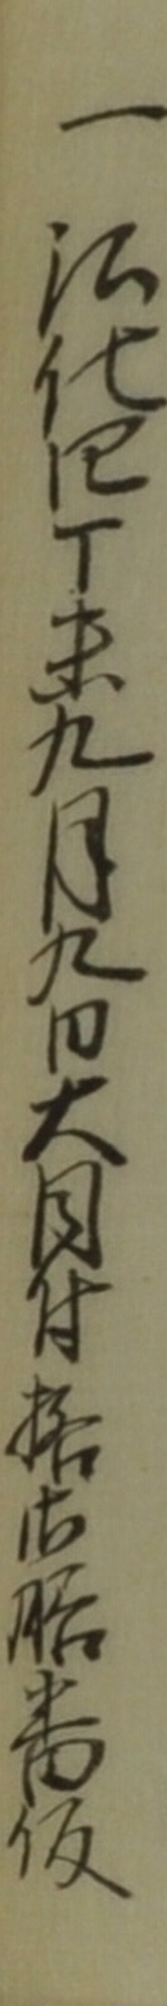一弘化四丁未九月九日大目付格御膳番仮役

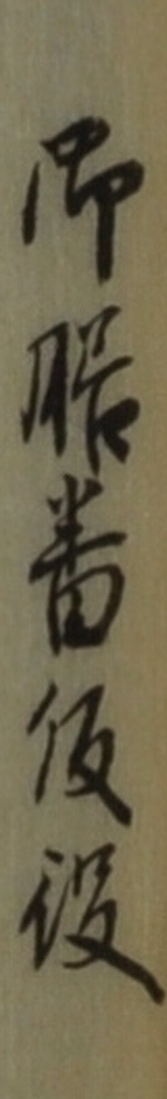御膳番仮役
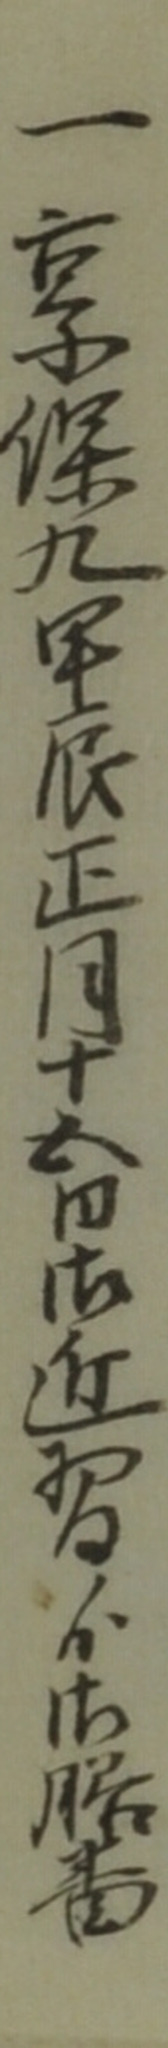一享保九甲辰正月十五日御近習ゟ御膳番
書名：諸御役代々録（四）
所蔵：伊那市立高遠町図書館・合同会社AMANE
